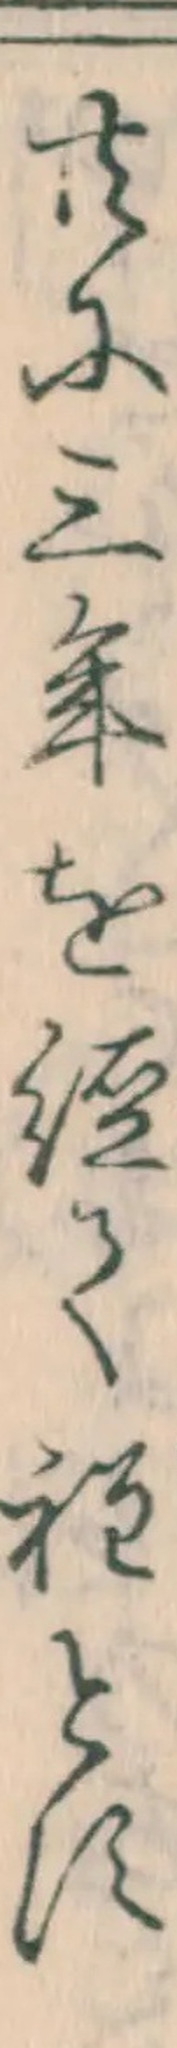共に三年を経て程とす
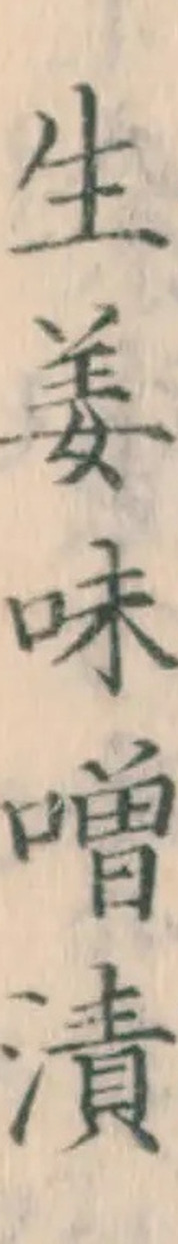生姜味噌漬
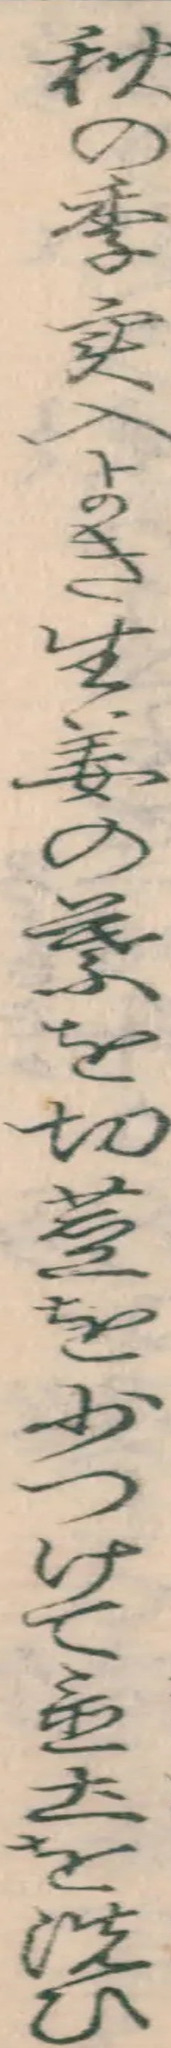秋の季実入よき生姜の葉を切茎を少つけて置土を洗ひ
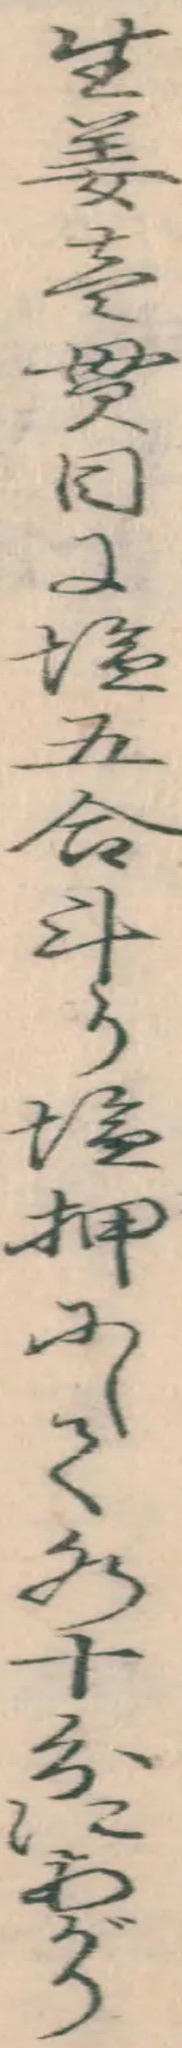生姜一貫目に塩五合斗り塩押にして水十分にあがり
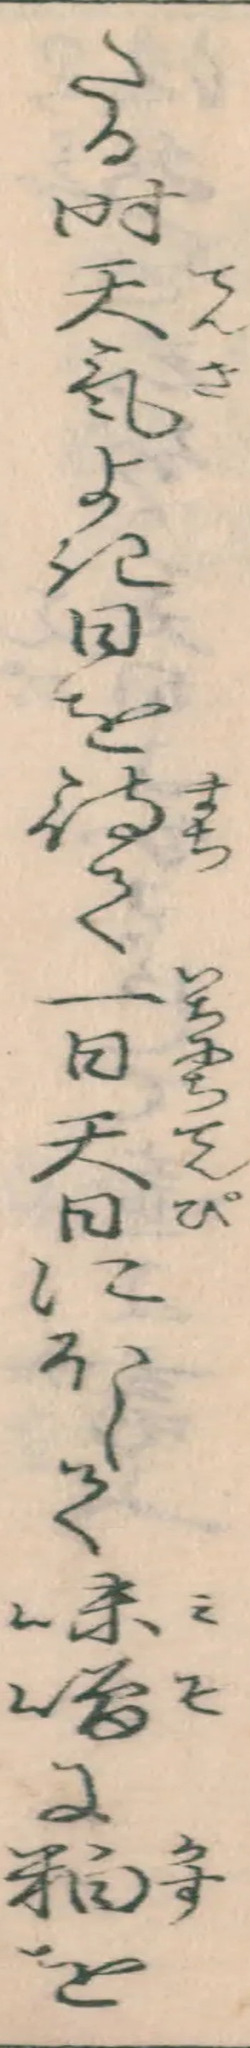たる時天気よき日を待て一日天日にほして味噌に粕を
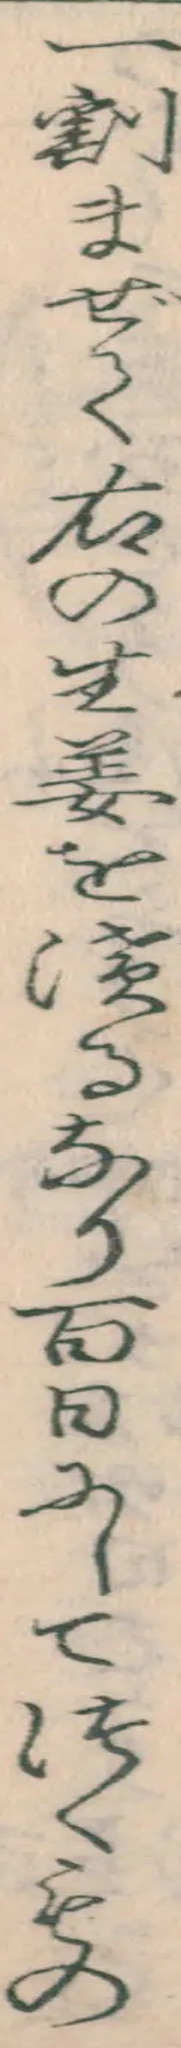一割まぜて右の生姜を漬るなり百日にしてつくもの
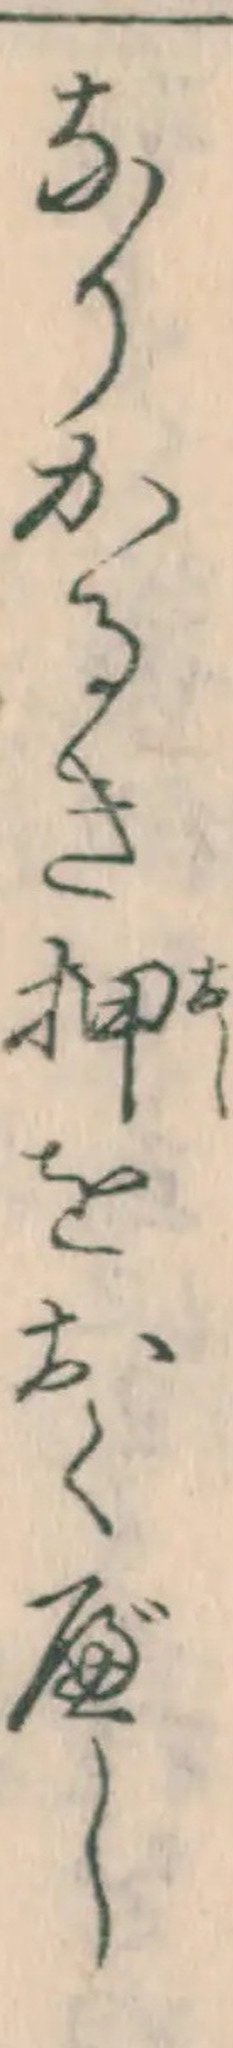なりかるき押をおくべし
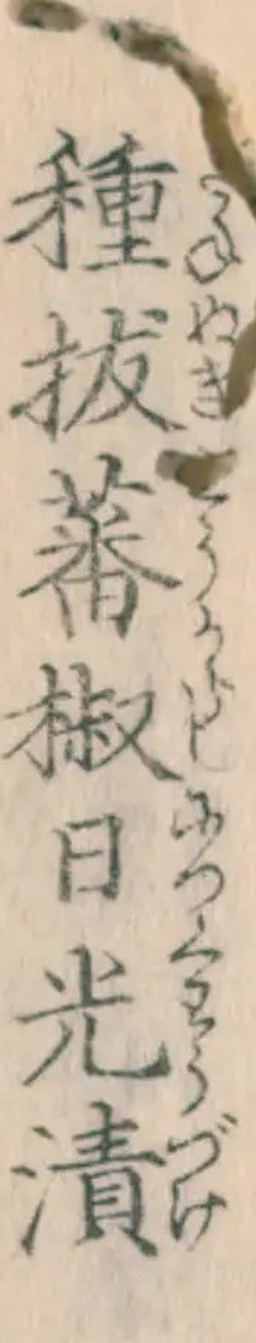種抜蕃椒日光漬

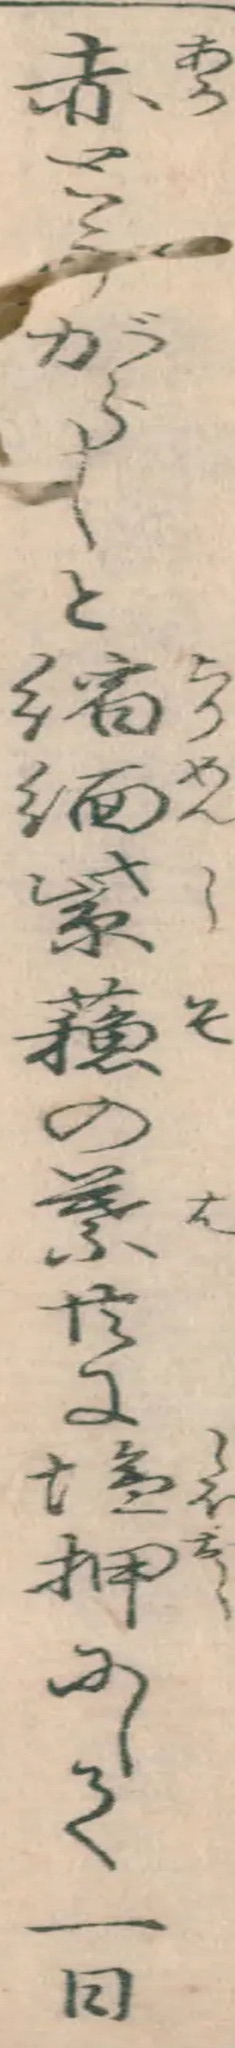赤とうがらしと縮緬紫蘇の葉共に塩押にして一日
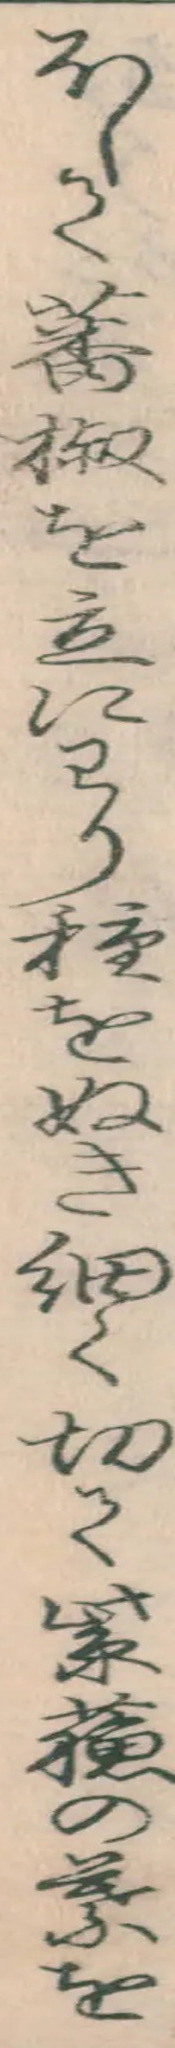ほして蕃椒を立にわり種をぬき細く切て紫蘇の葉を
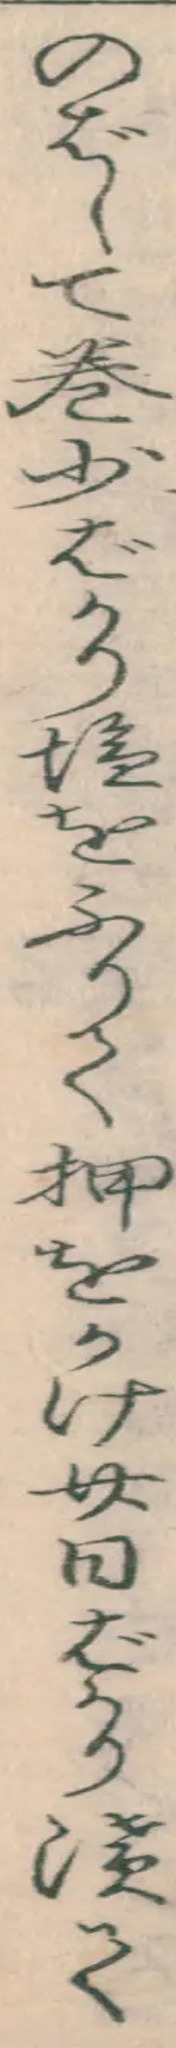のばして巻少ばかり塩をふりて押をかけ廿日ばかり漬て
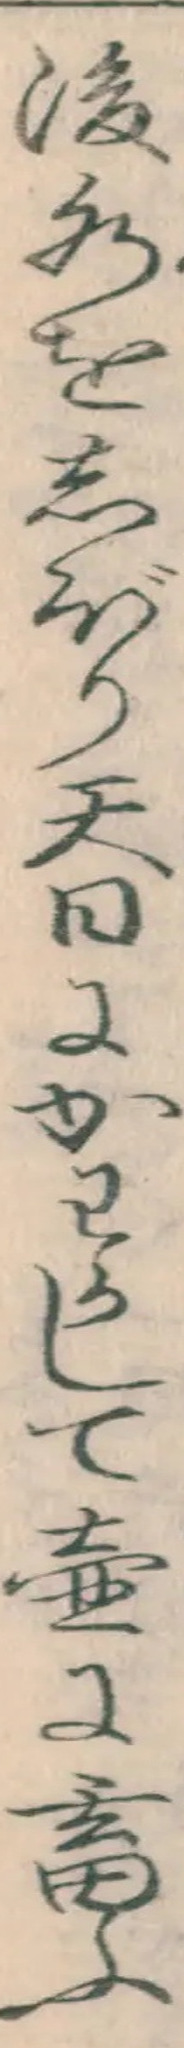後水をしぼり天日にかわかして壺に畜ふ
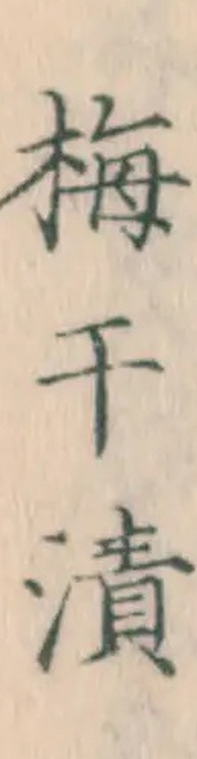梅干漬
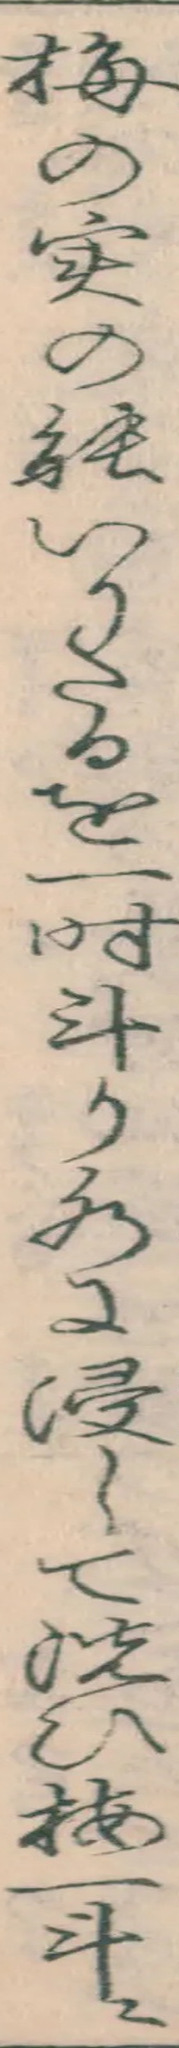梅の実の能いりたるを一時斗り水に浸して洗ひ梅一斗に
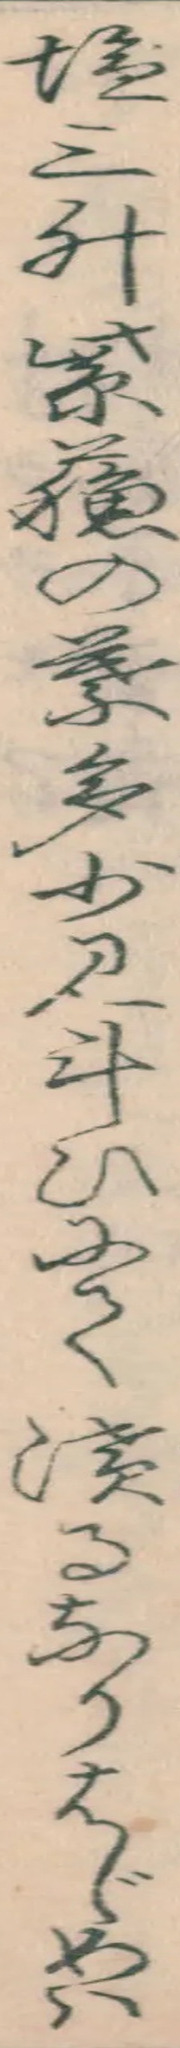塩三升紫蘇の葉多少見斗ひにて漬るなりはじめは
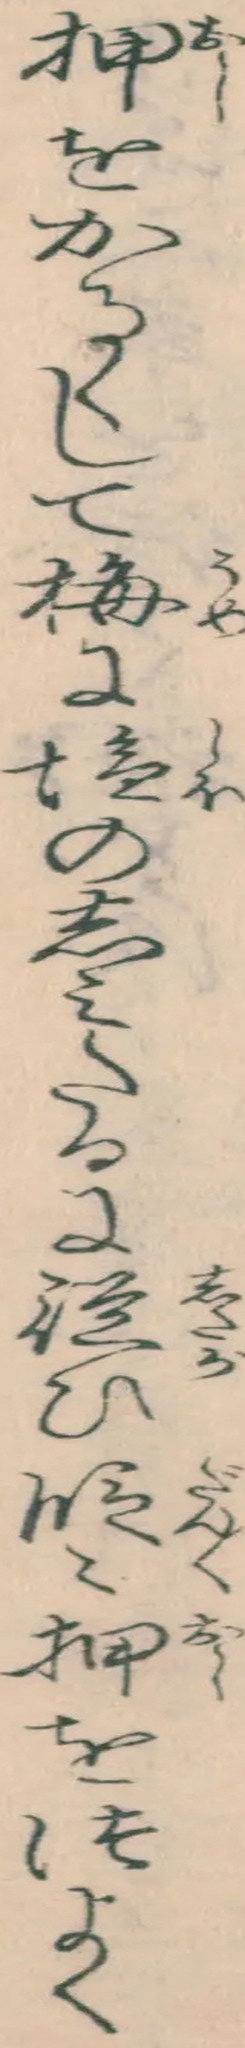押をかるくして梅に塩のしみたるに従ひ段々押をつよく
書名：四季漬物鹽嘉言
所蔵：国立国会図書館 National Diet Library, JAPAN
